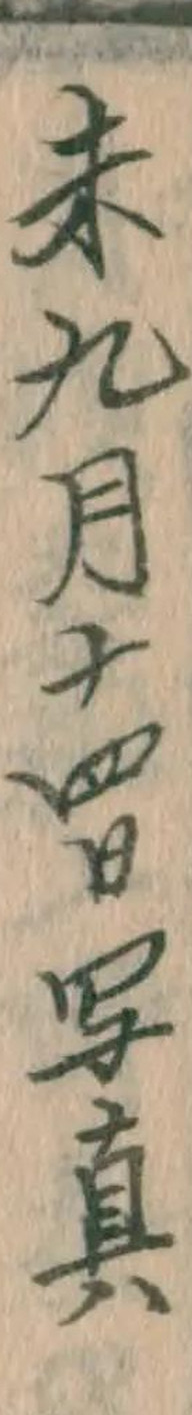未九月十四日写真
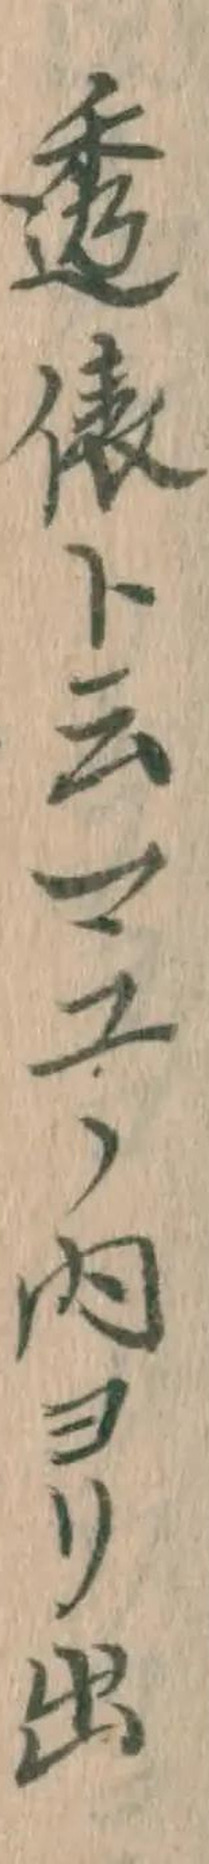透俵ト云マユノ内ヨリ出
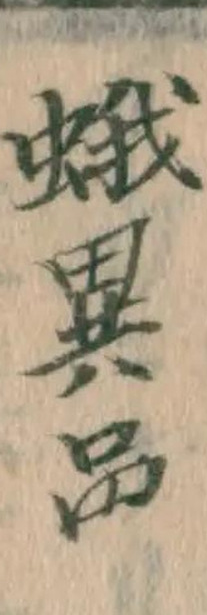蛾異品
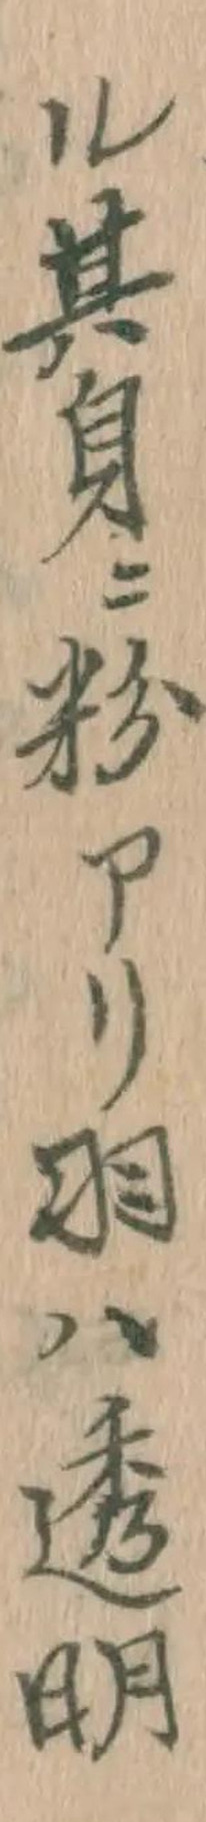ル其身ニ粉アリ羽ハ透明
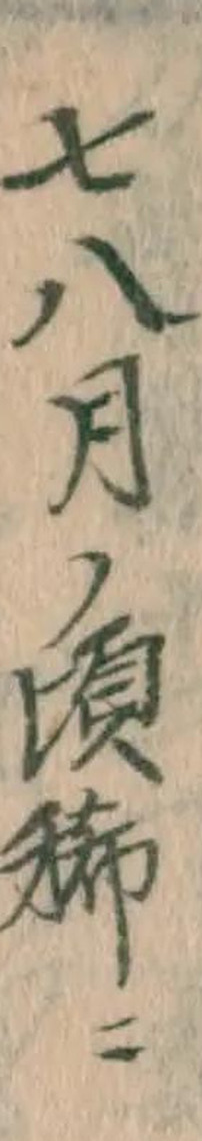七八月ノ頃稀ニ
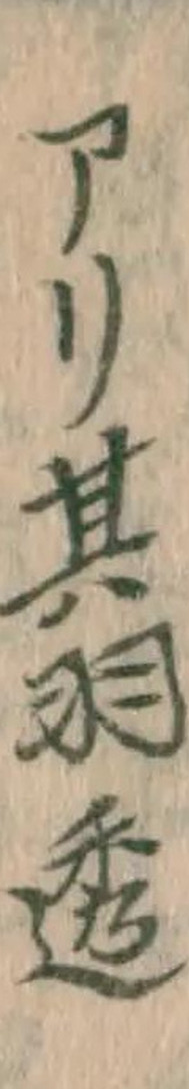アリ其羽透
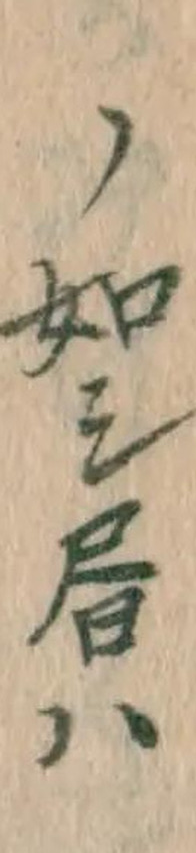ノ如シ昼ハ
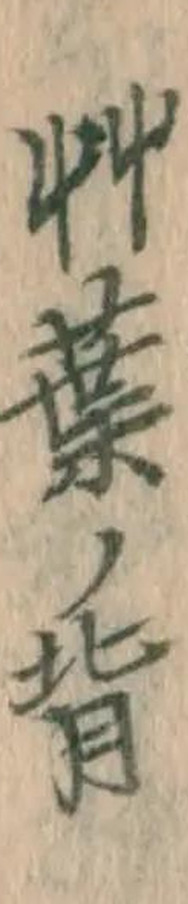艸葉ノ背
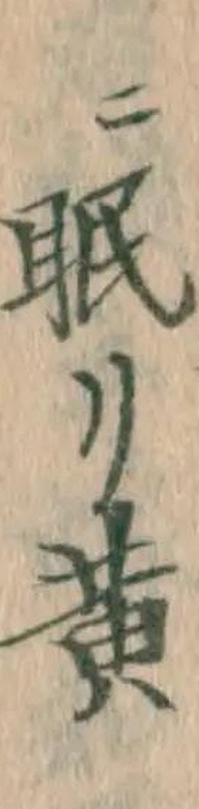ニ眠リ黄
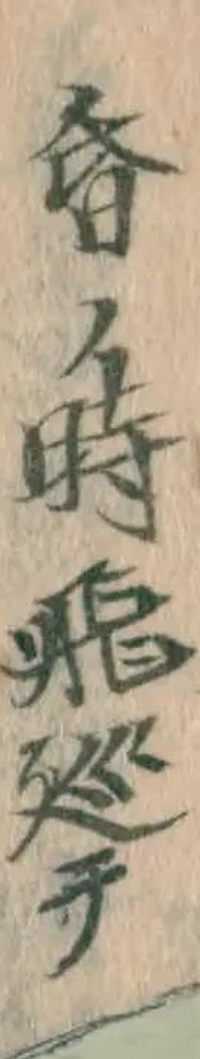昏ノ時飛巡テ
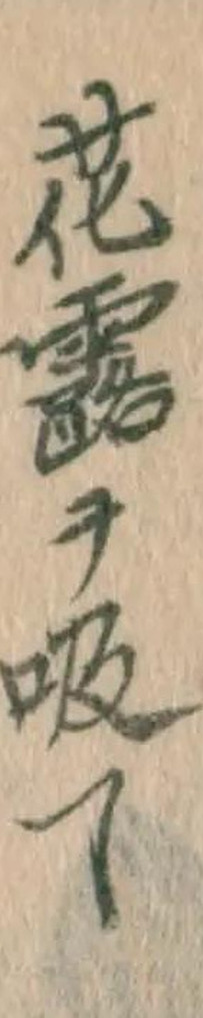花露ヲ吸フ
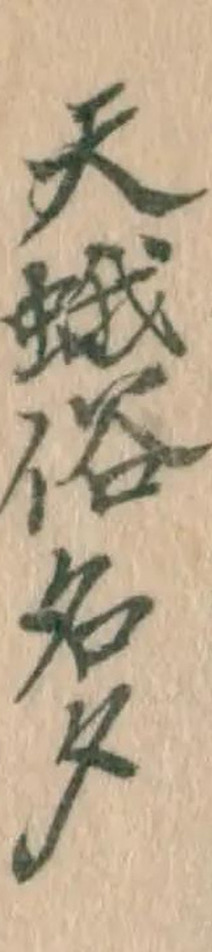天蛾俗名夕
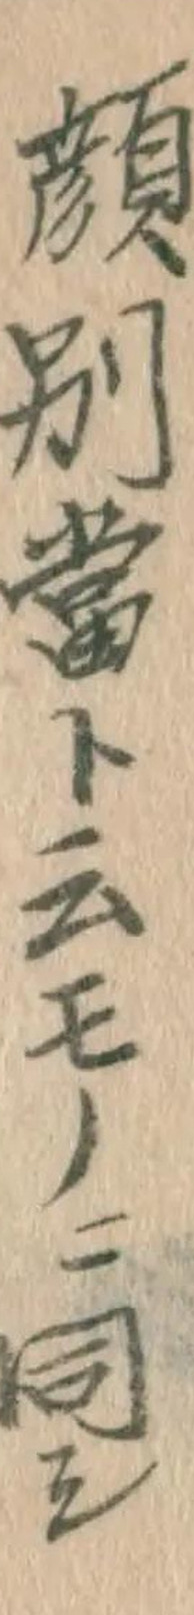顔別當ト云モノニ同シ
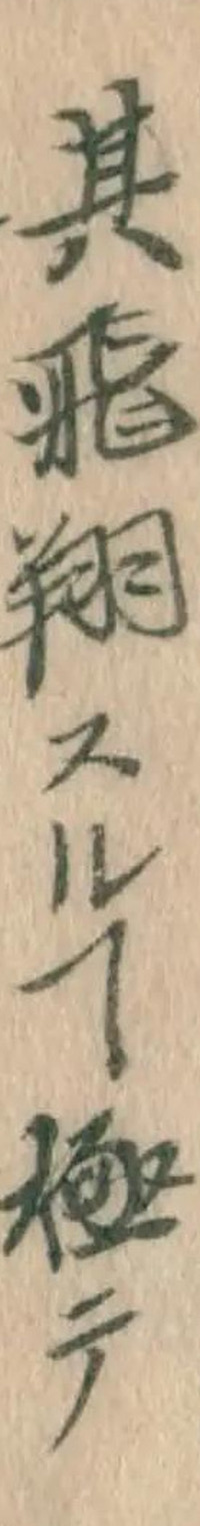其飛翔スルコト極テ
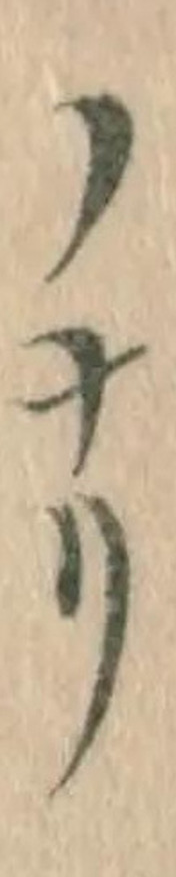ノナリ

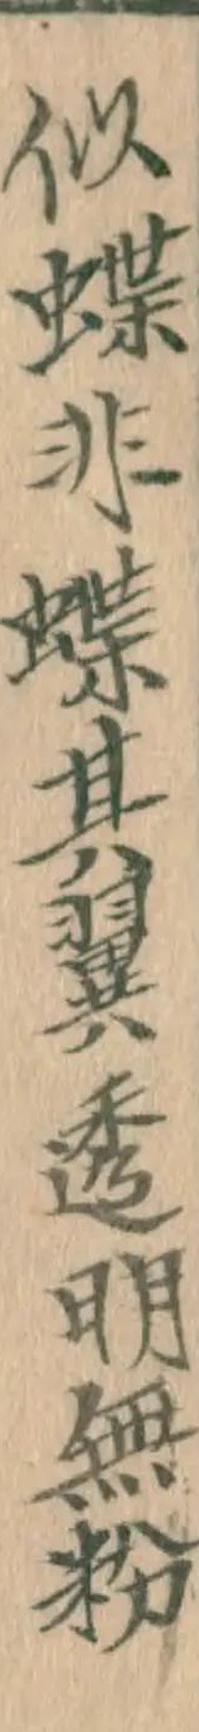似蝶非蝶其翼透明無粉
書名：千蟲譜 3巻. [1]
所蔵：国立国会図書館 National Diet Library, JAPAN
